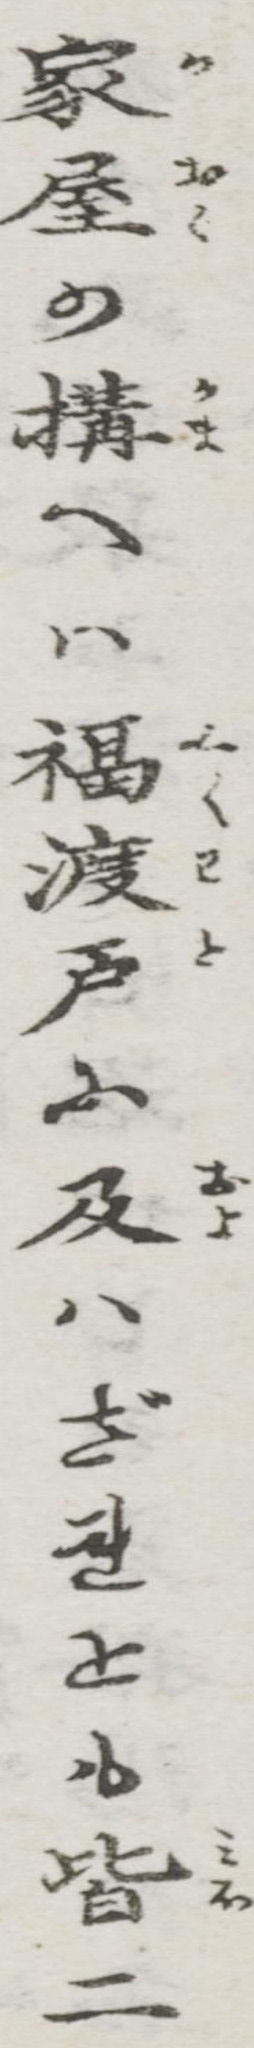家屋の構へは福渡戸に及はざれとも皆二
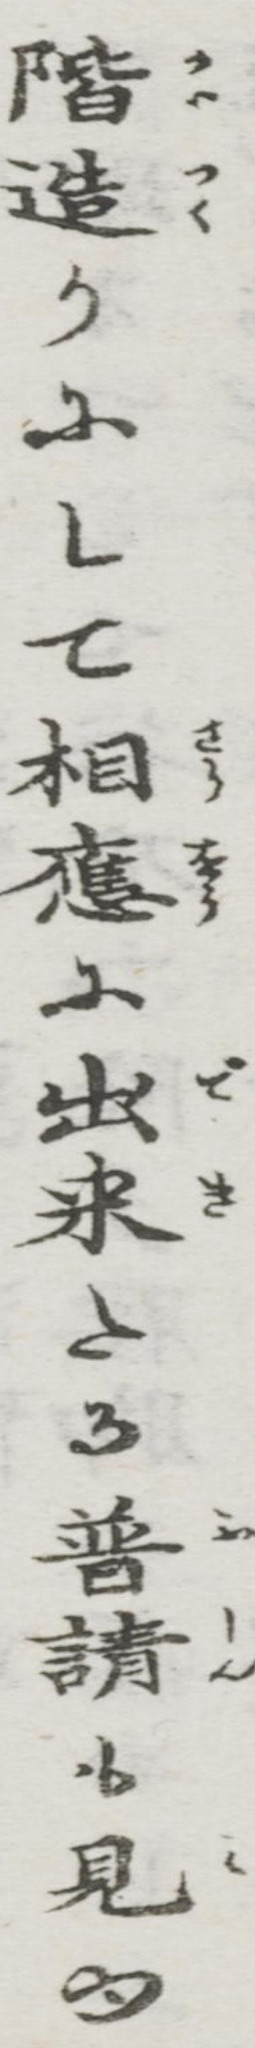階造りにして相応に出来たる普請も見ゆ
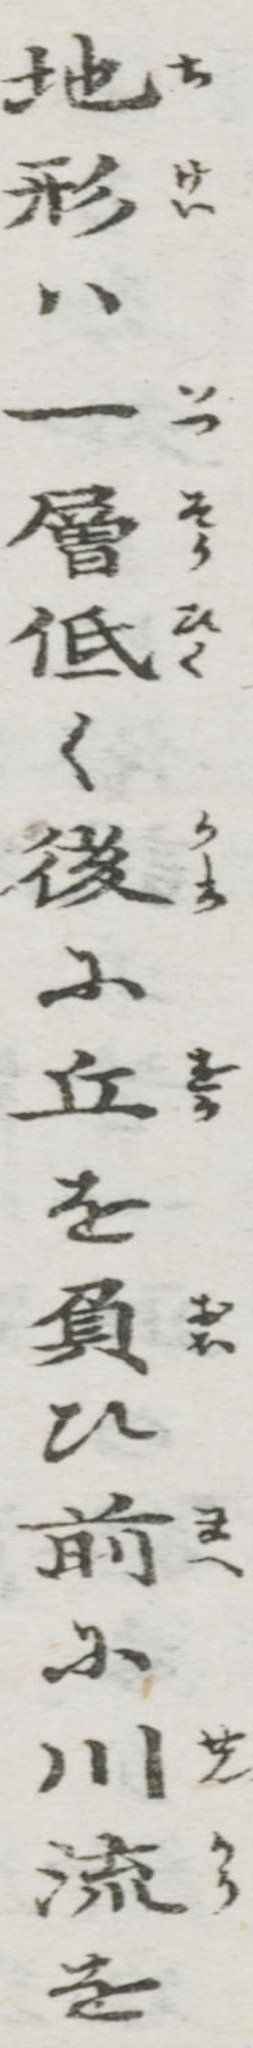地形は一層低く後に丘を負ひ前に川流を
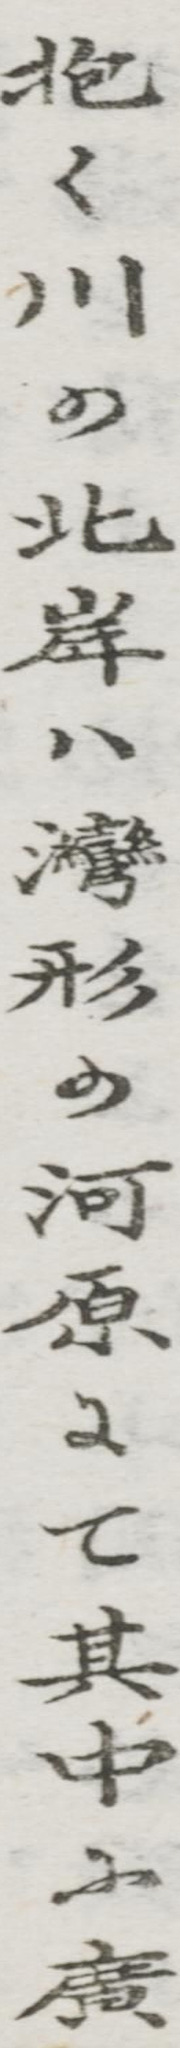抱く川の北岸は灣形の河原にて其中に廣
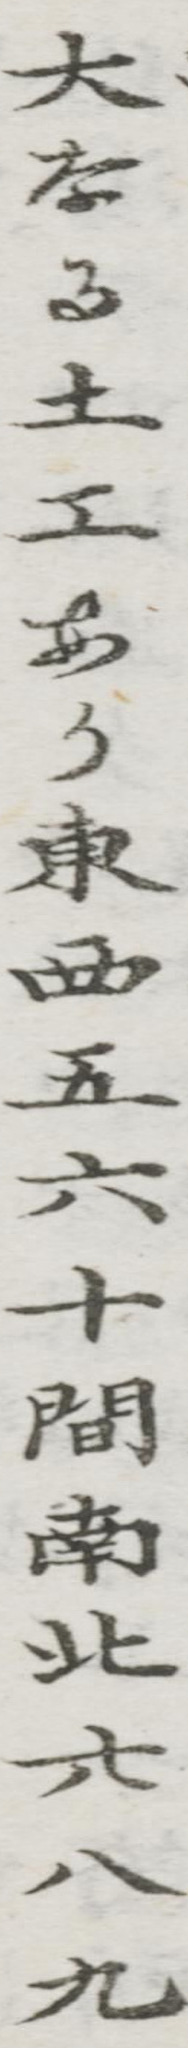大なる土工あり東西五六十間南北七八九
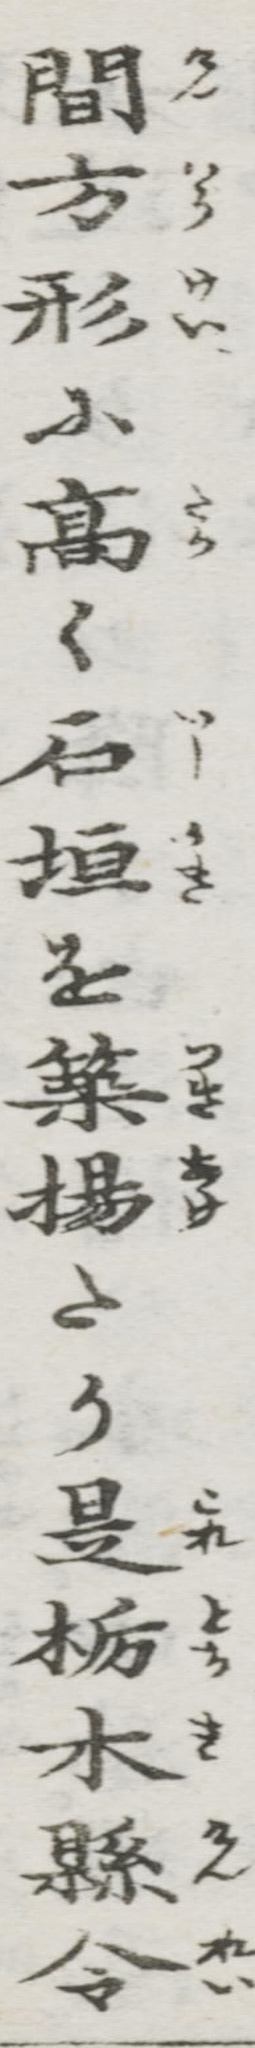間方形に高く石垣を築揚たり是栃木縣令
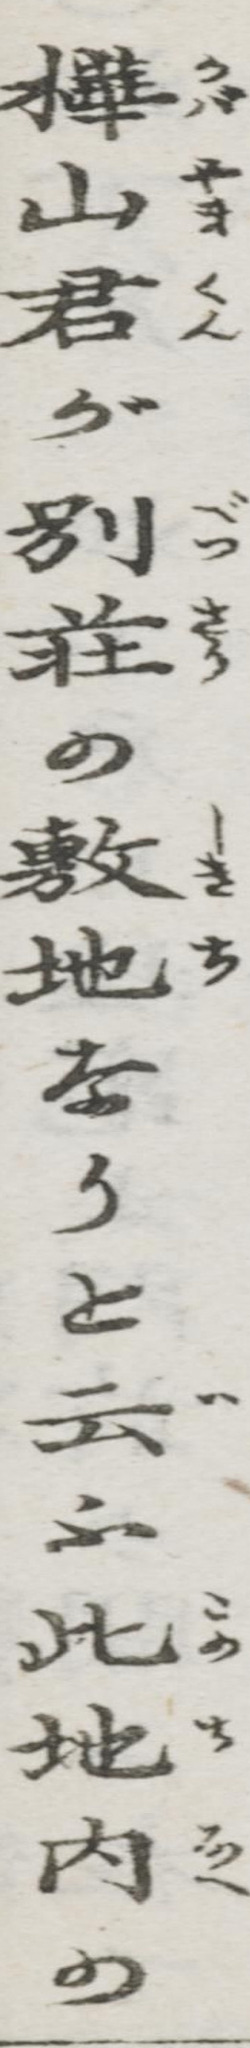樺山君が別荘の敷地なりと云ふ此地内の
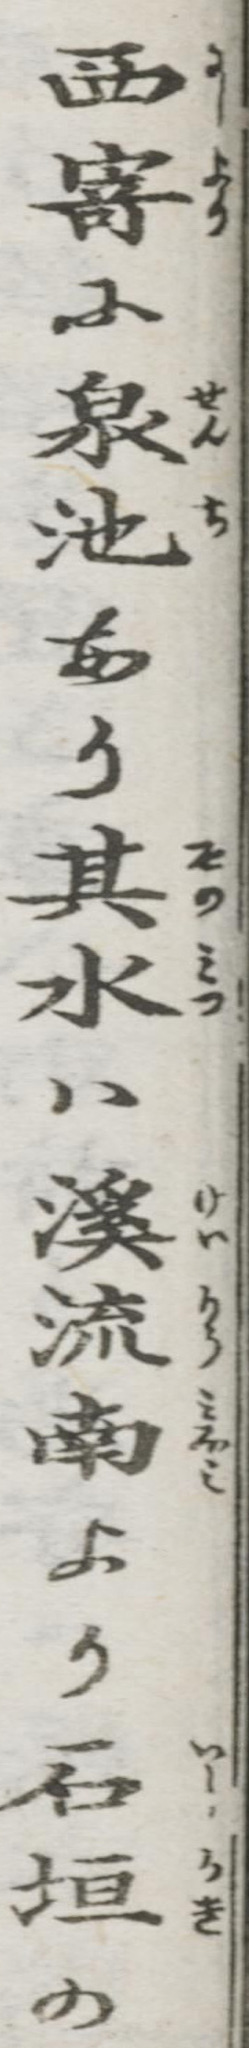西寄に泉池あり其水は渓流南より石垣の
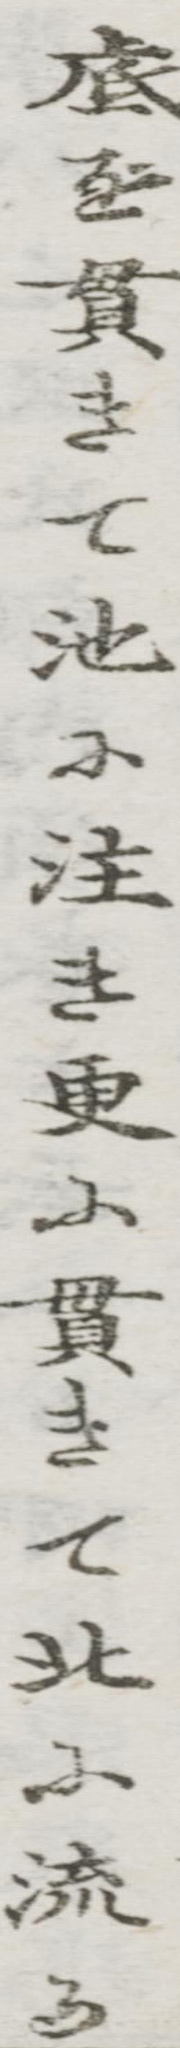底を貫きて池に注き更に貫きて北に流る
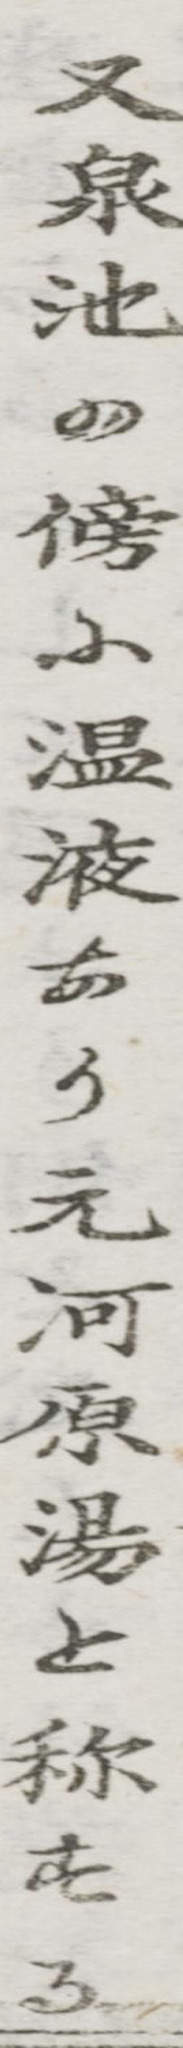又泉地の傍に温液あり元河原湯と称する
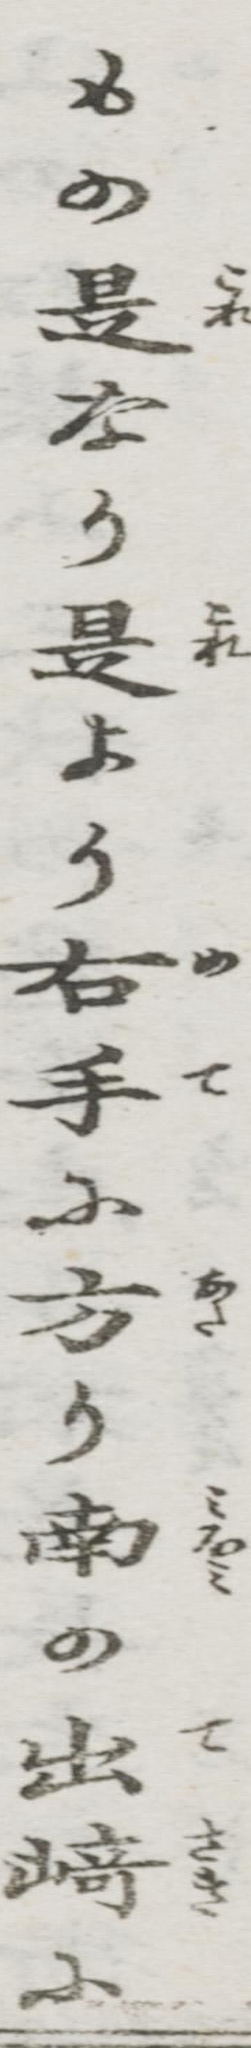もの是なり是より右手に方り南の出崎に
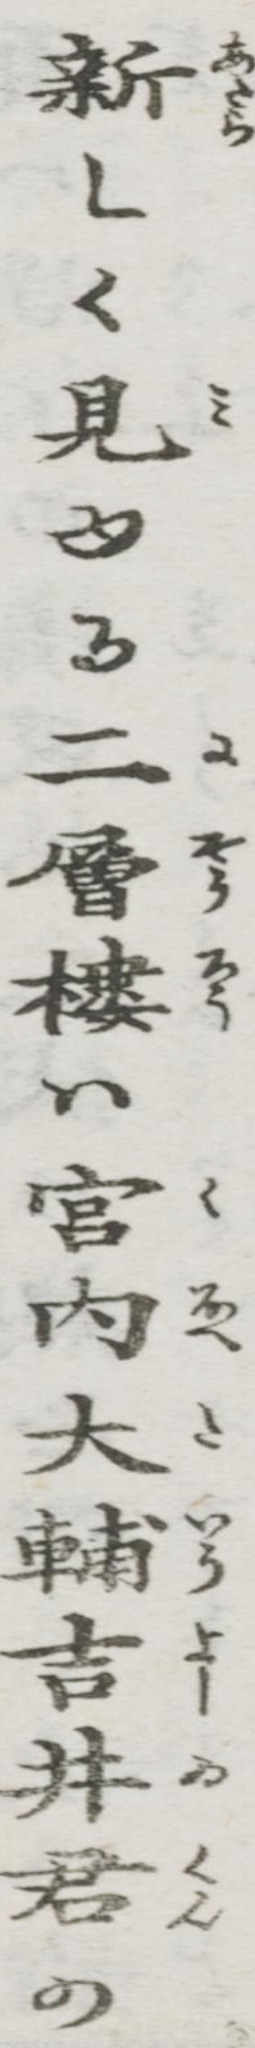新しく見ゆる二層樓は宮内大輔吉井君の
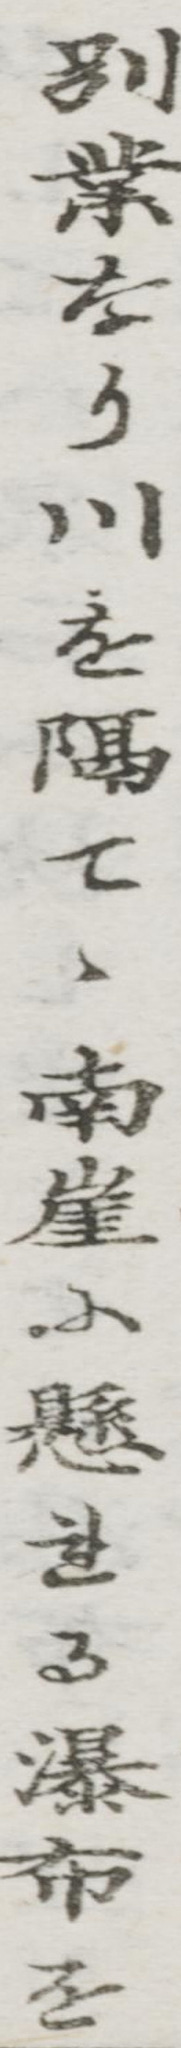別業なり川を隔てゝ南崖に懸れる瀑布を
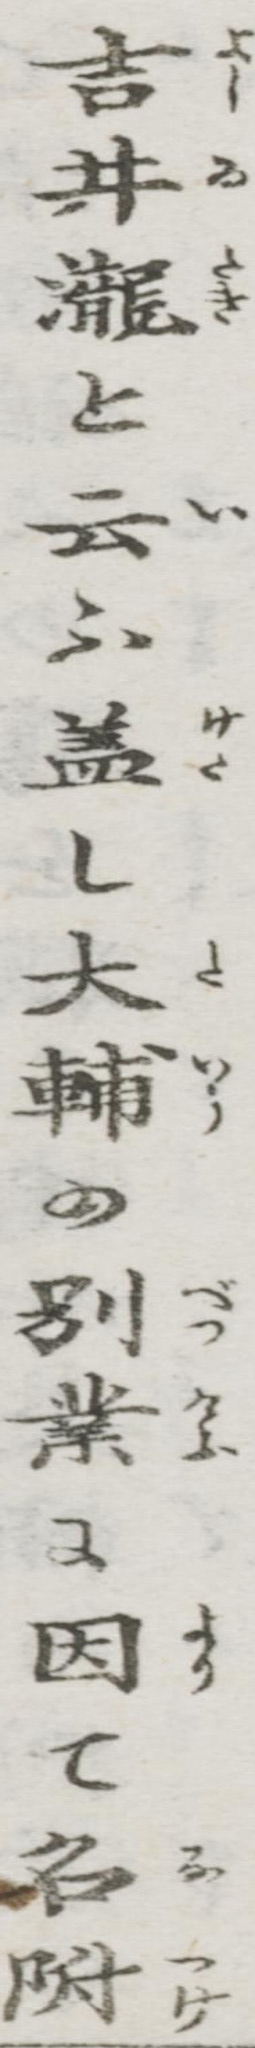吉井瀧と云ふ盖し大輔の別業に因て名附
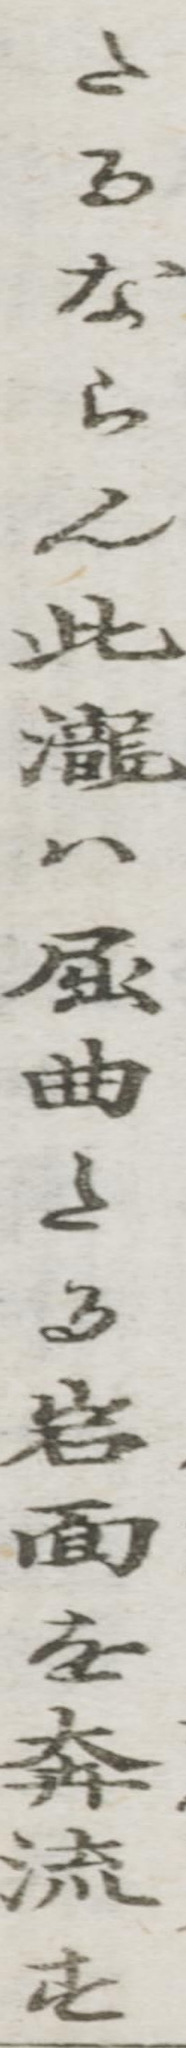たるならん此瀧は屈曲たる岩面を奔流す

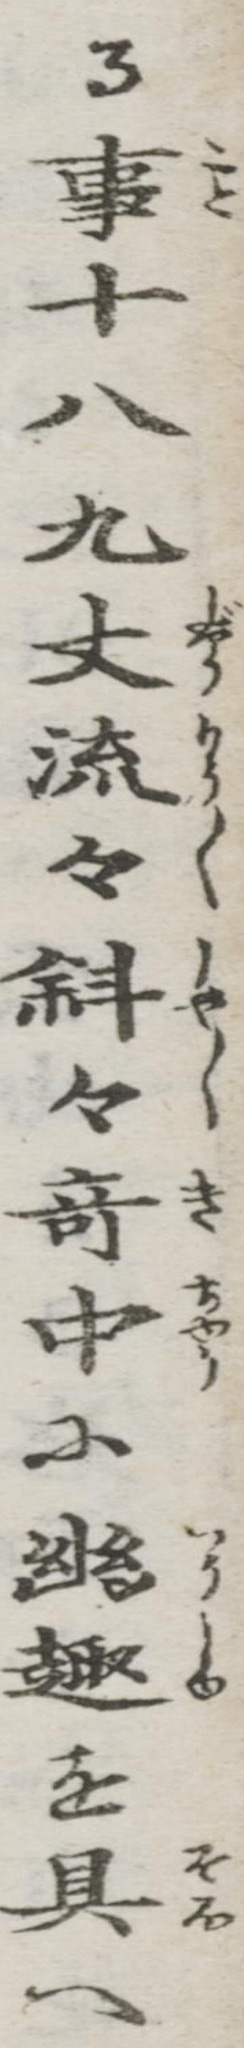る事十八九丈流々斜々奇中に幽諏を具へ
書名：塩原繁昌記　全
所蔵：東京大学地震研究所図書室 Earthquake Research Institute Library, The University of Tokyo, JAPAN
